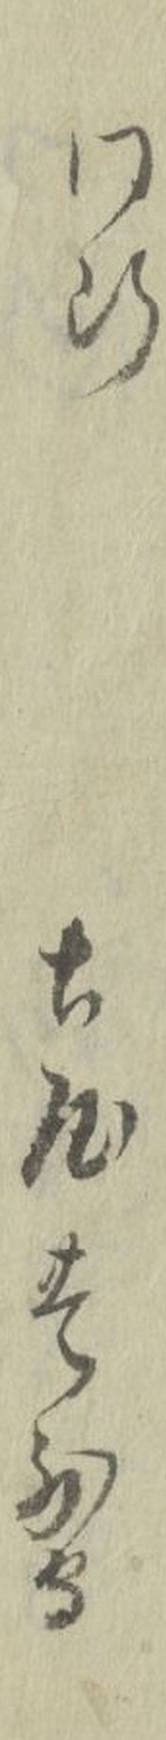同断古屋豊前守
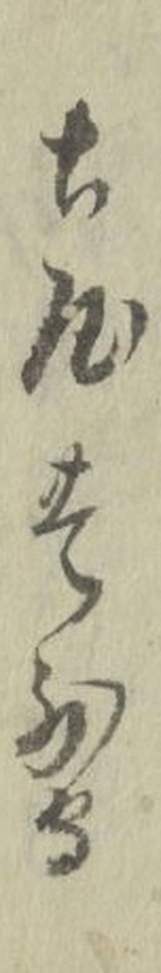同断古屋豊前守
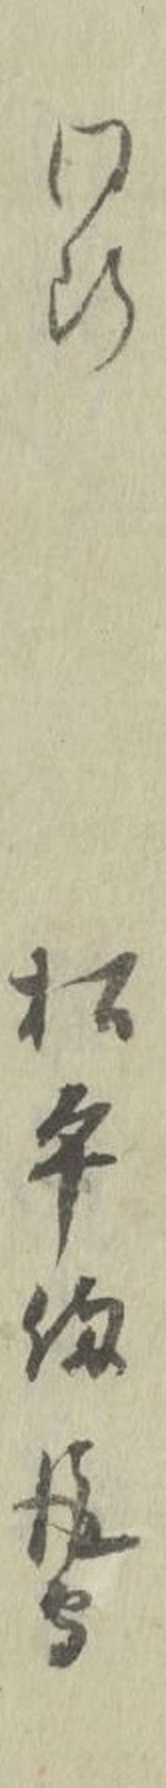同断松平備後守
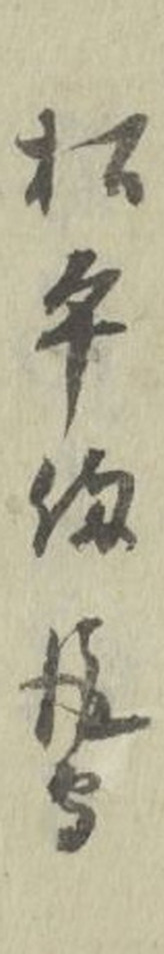同断松平備後守

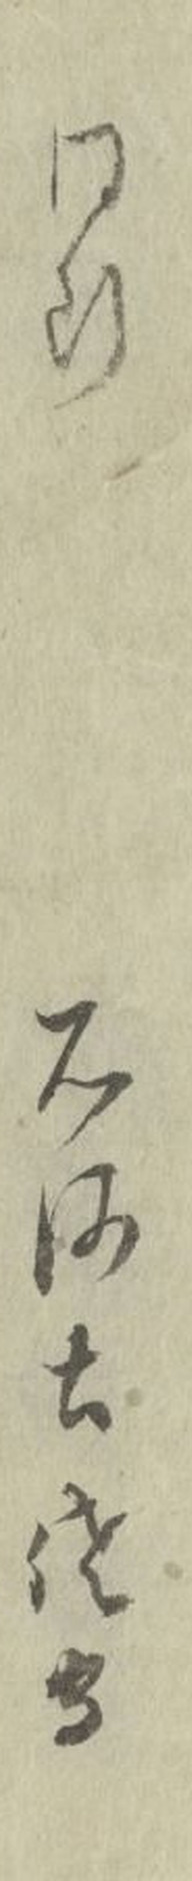同断石河土佐守
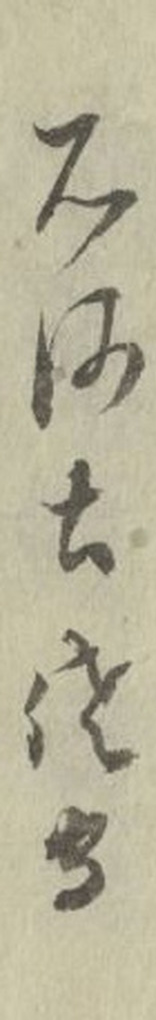同断石河土佐守
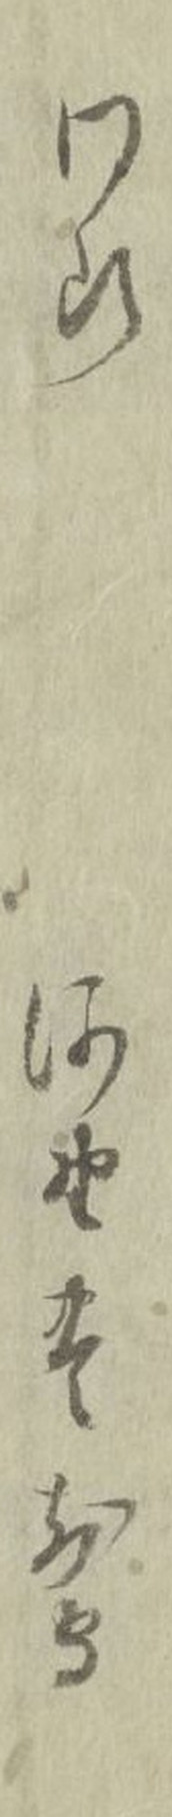同断河野豊前守
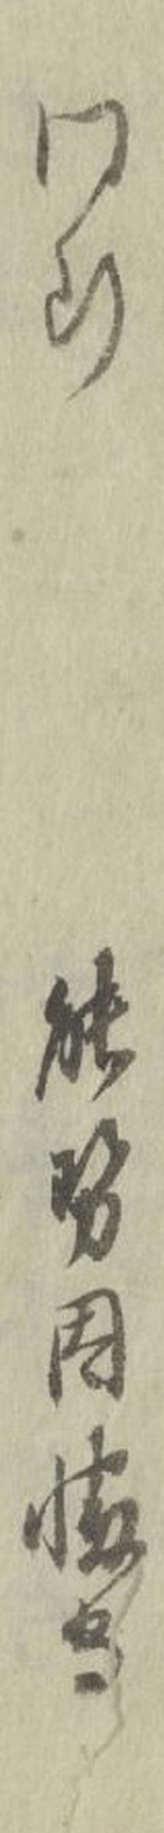同断能勢因幡守
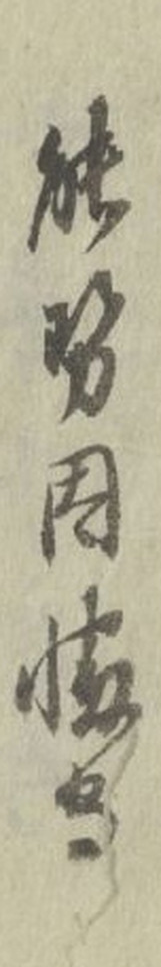同断能勢因幡守
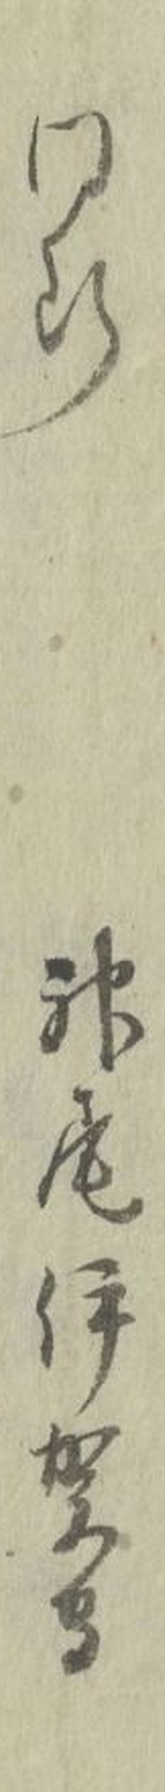同断神尾伊賀守
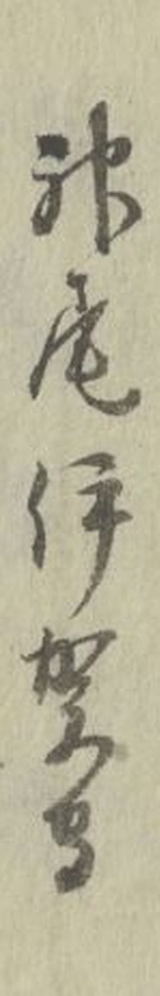同断神尾伊賀守
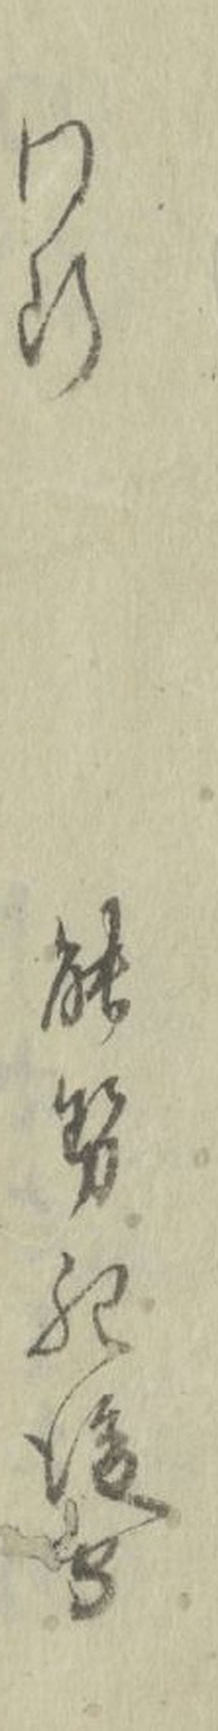同断能勢肥後守
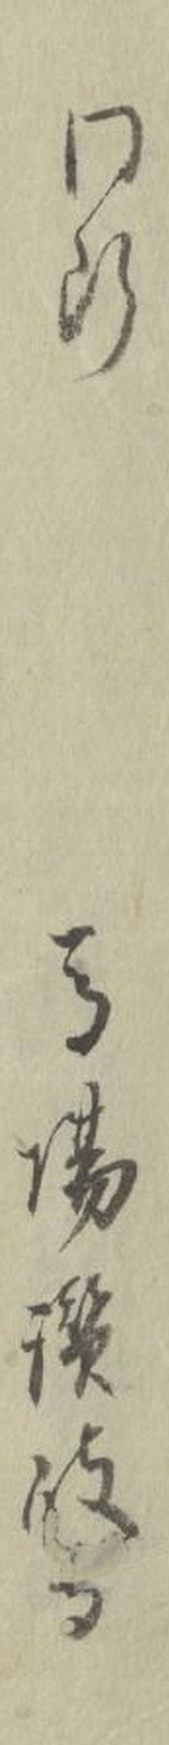同断馬場讃岐守
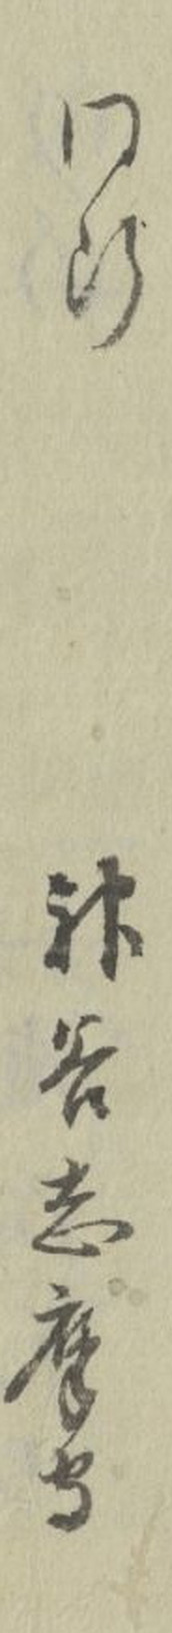同断神谷志摩守
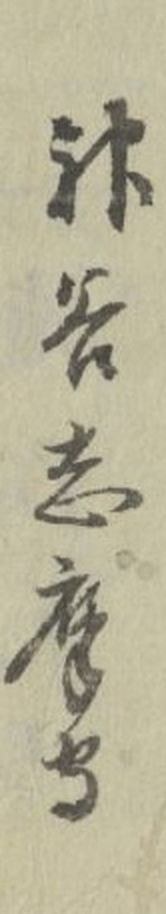同断神谷志摩守
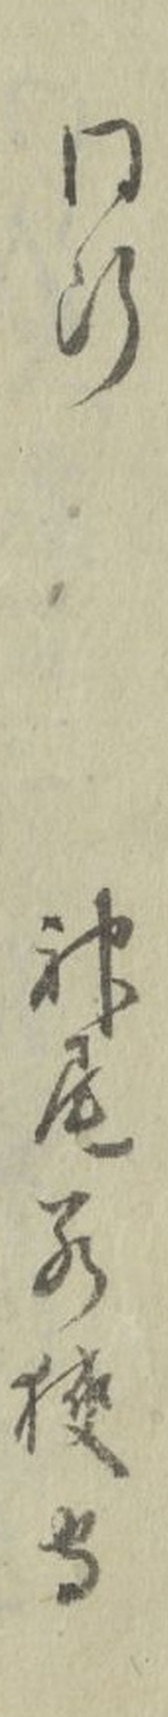同断神尾若狭守
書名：琉球来朝記 自八至十四終
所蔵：University of the Ryukyus Library
